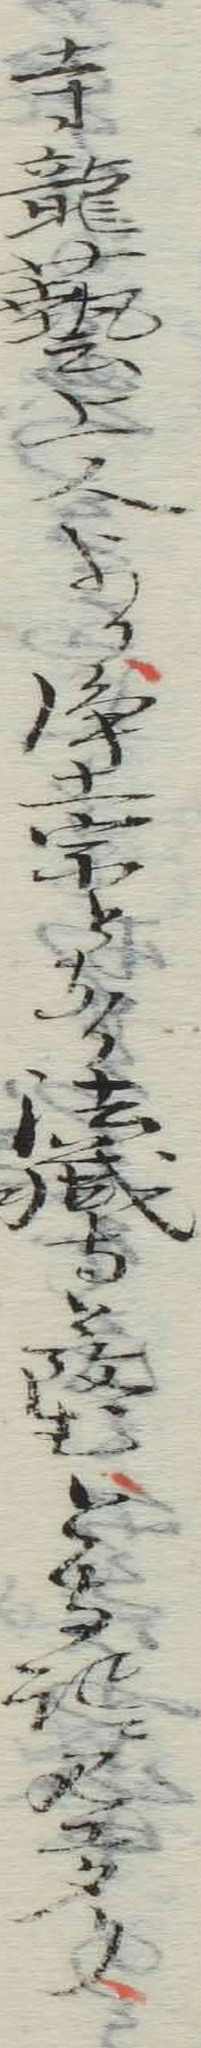寺龍藝上人より、浄土宗となり法蔵寺と改む、と寺記ニ見エタリ、
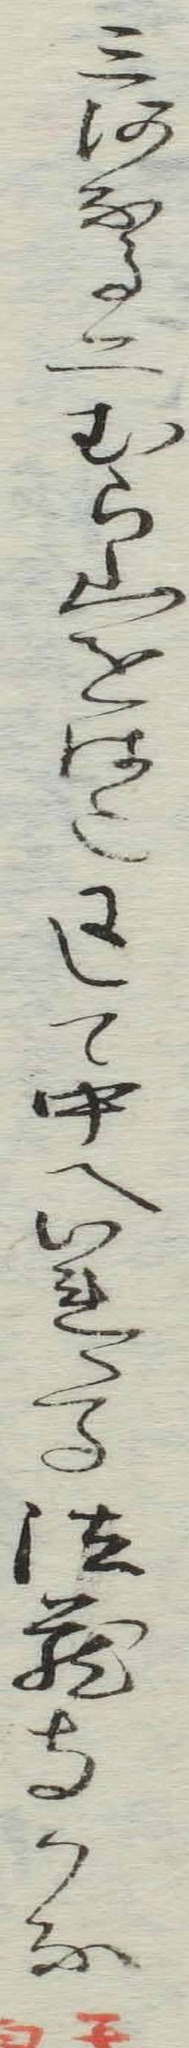三河なる二むら山をはこにして中へいれたる法蔵寺かなモ白
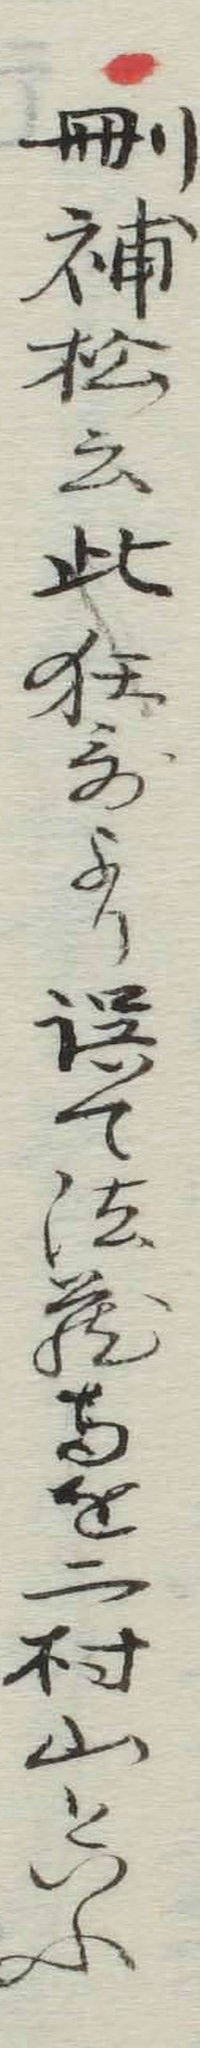●刪補松云此狂歌より誤て法蔵寺を二村山といふ
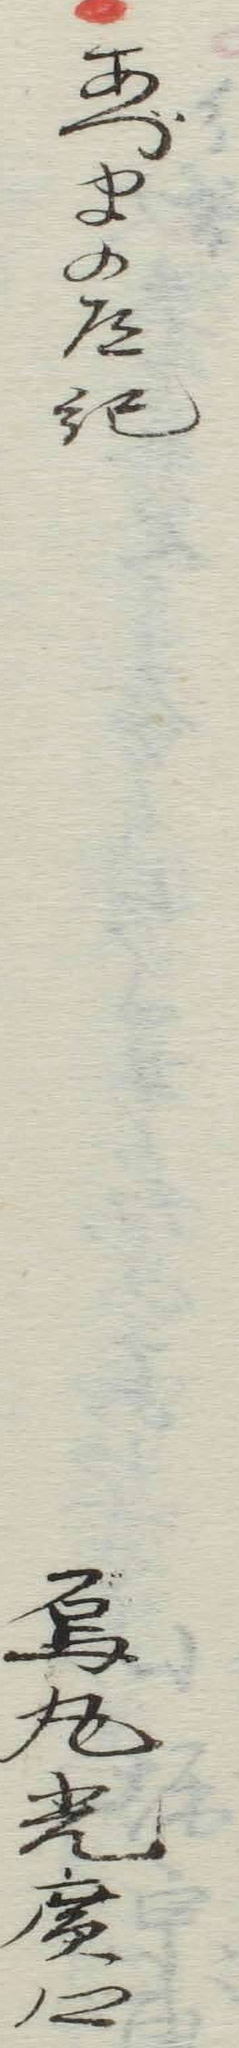●あづまの道記烏丸光廣卿
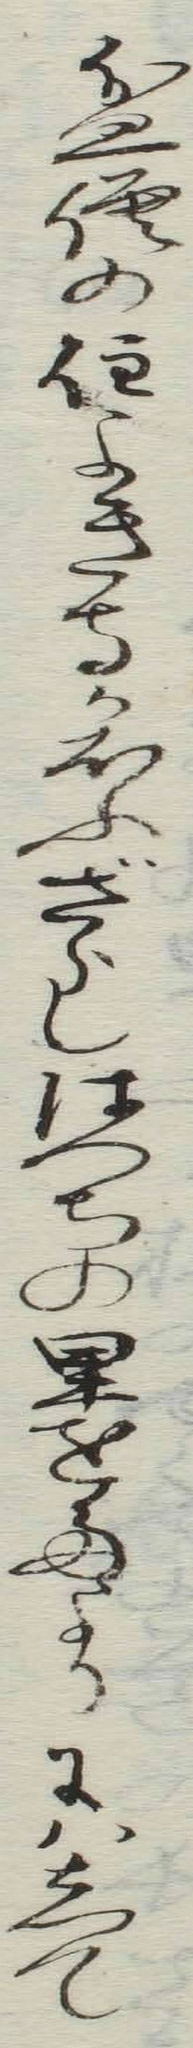貧僧の住よき寺かほふざうしはつちの里をたよりにはして
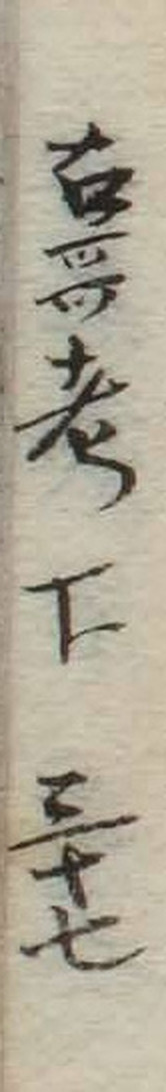古歌考下三十七

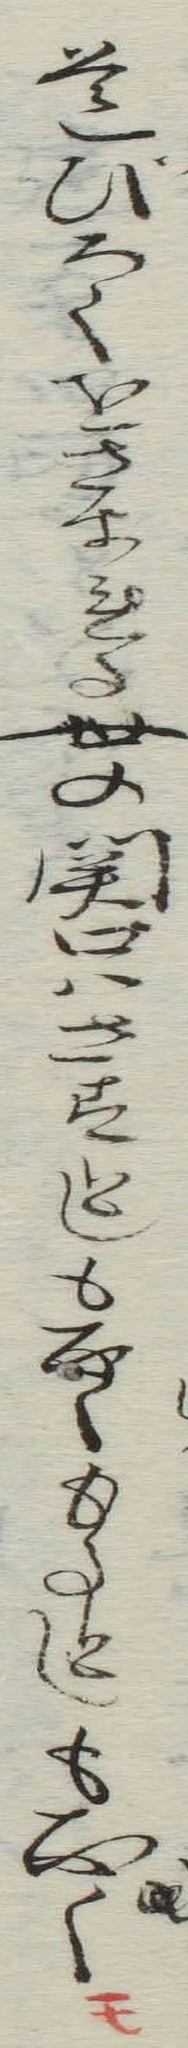道びろくをさまれる世の関口はさすとしもなくもるとしもなくモ
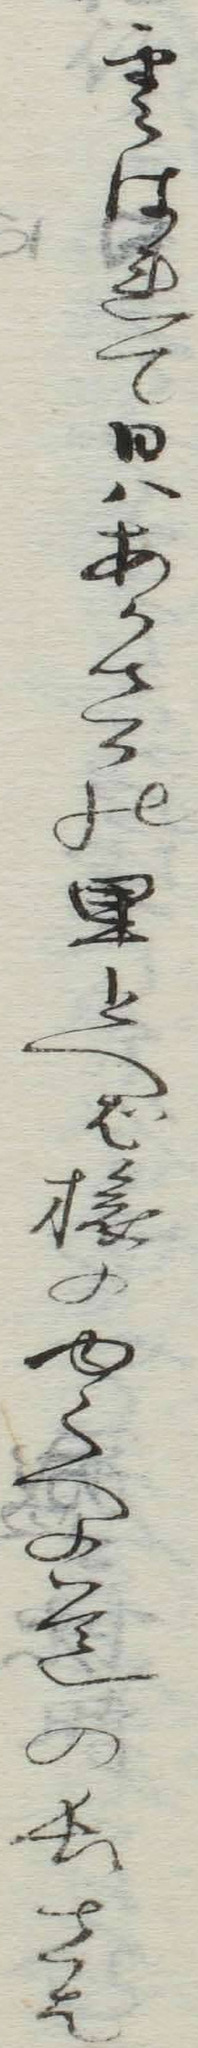雲はれて日はあかさかの里とへば旅のゆくへの道の長さは

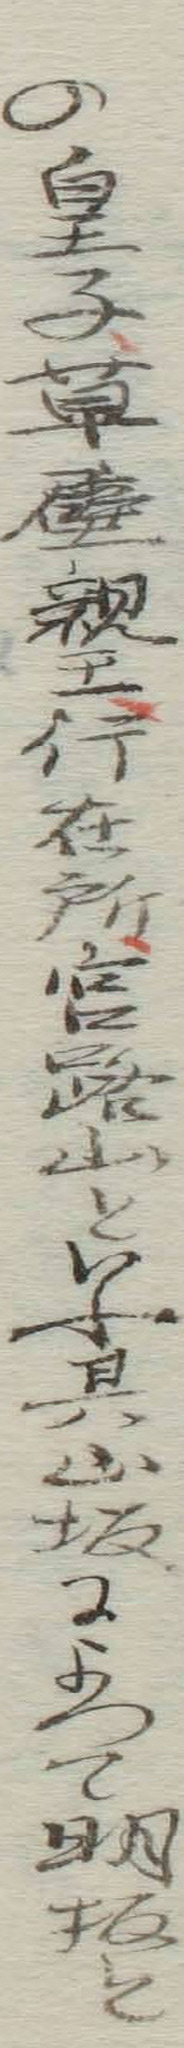の皇子、草壁親王、行在所、宮路山といふ其山坂によつて明坂と
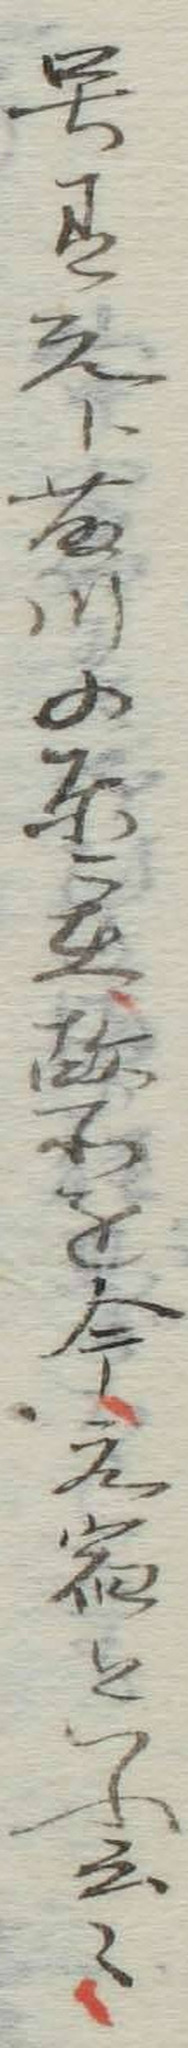号す元ト藤川の東ニ在、故所を今、本宿といふ云々、
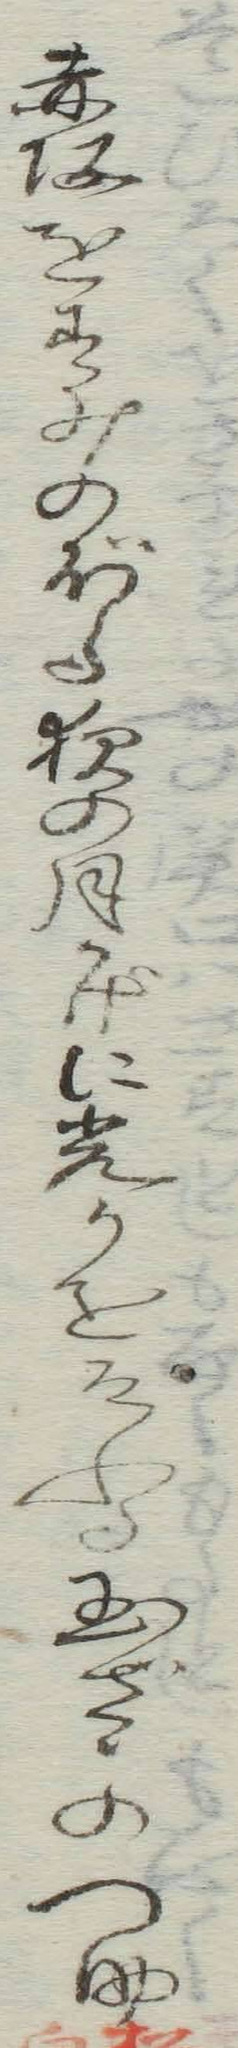赤坂をすみのぼる夜の月かげに光りをそふる玉ざゝのつゆ松白
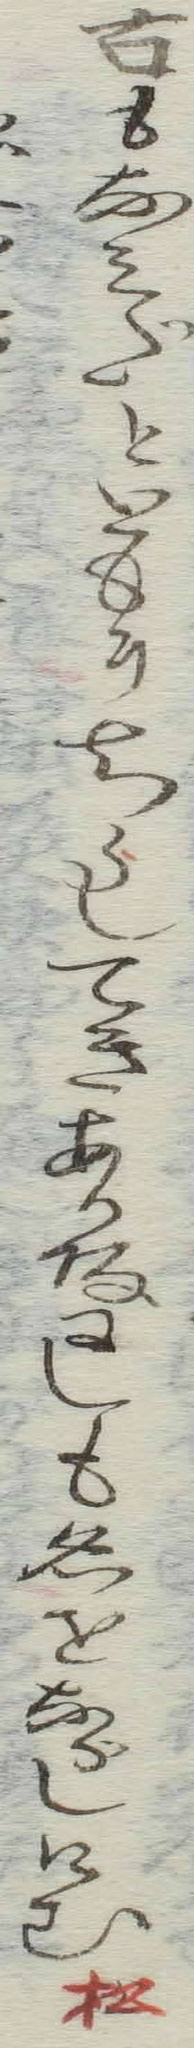古もなみだとともにちらしてきあか坂にしも名をながしけむ松
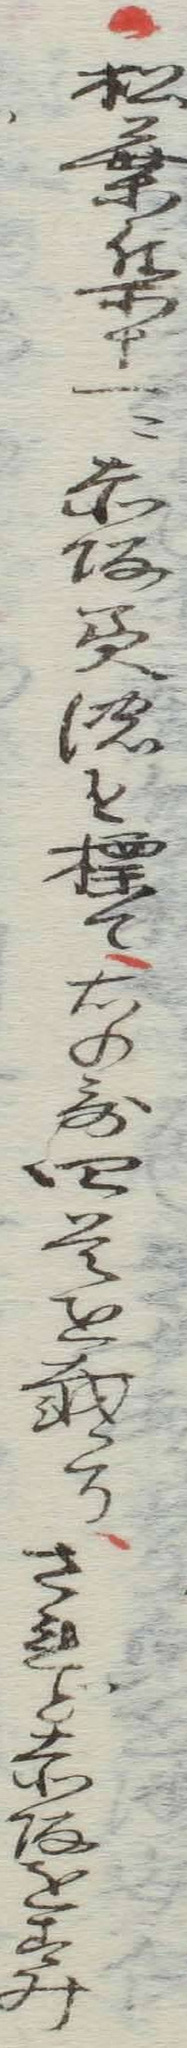●松葉集十一ニ赤坂美濃と標て、右の歌四首を載たり、されど赤坂をすみ
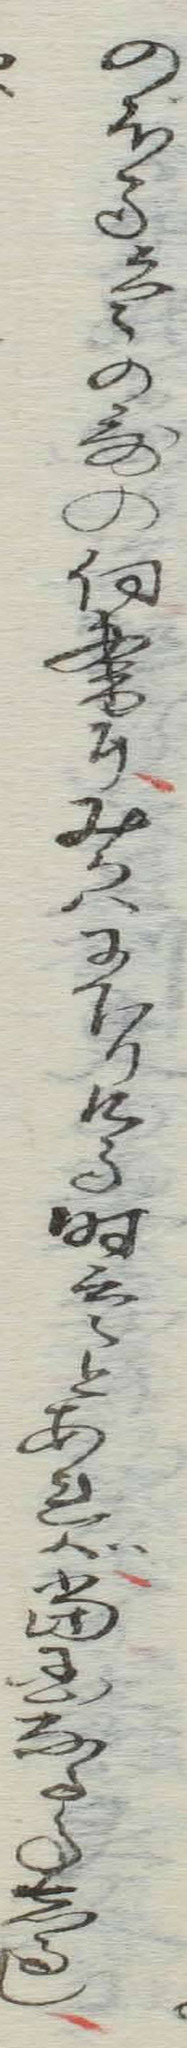のぼる云々の歌の詞書に、みかはに下りける時云々とあれば、当国なる事しるし、
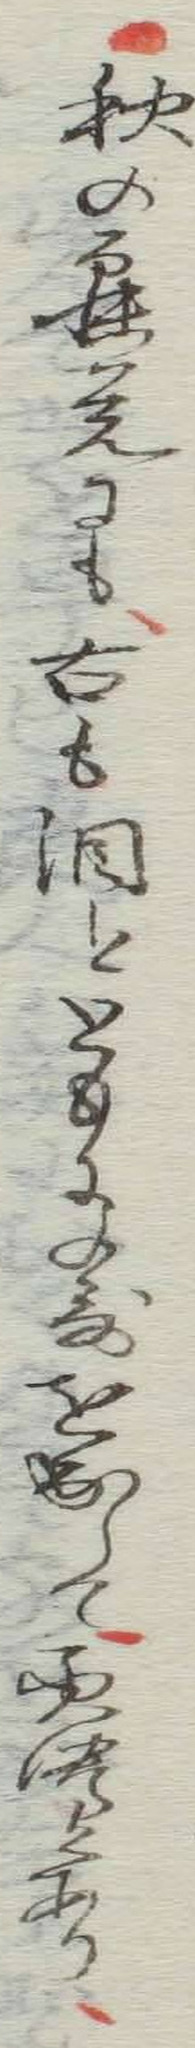●秋の寝覚にも、古も泪とともにの歌を出して、美濃とあり、
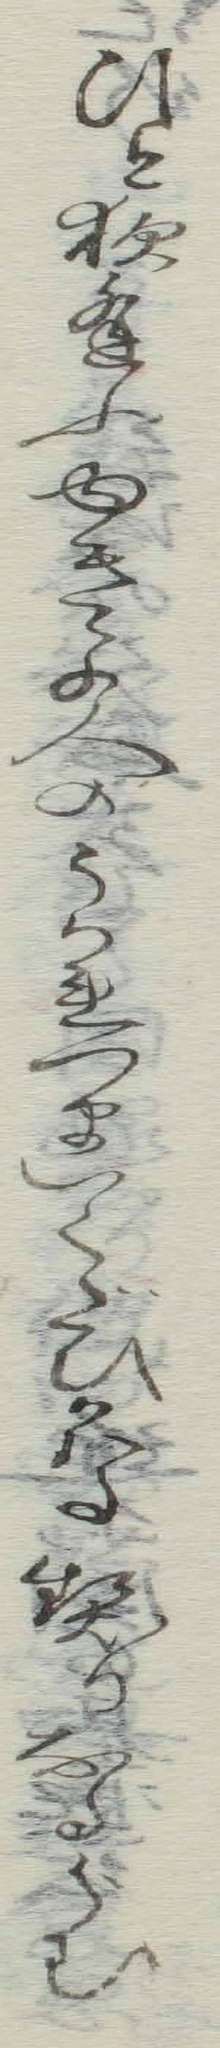ひと夜逢ふゆきゝのひとのうかれつまいくたびかはる契りなるらむ
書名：三河国古跡考
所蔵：国文学研究資料館
